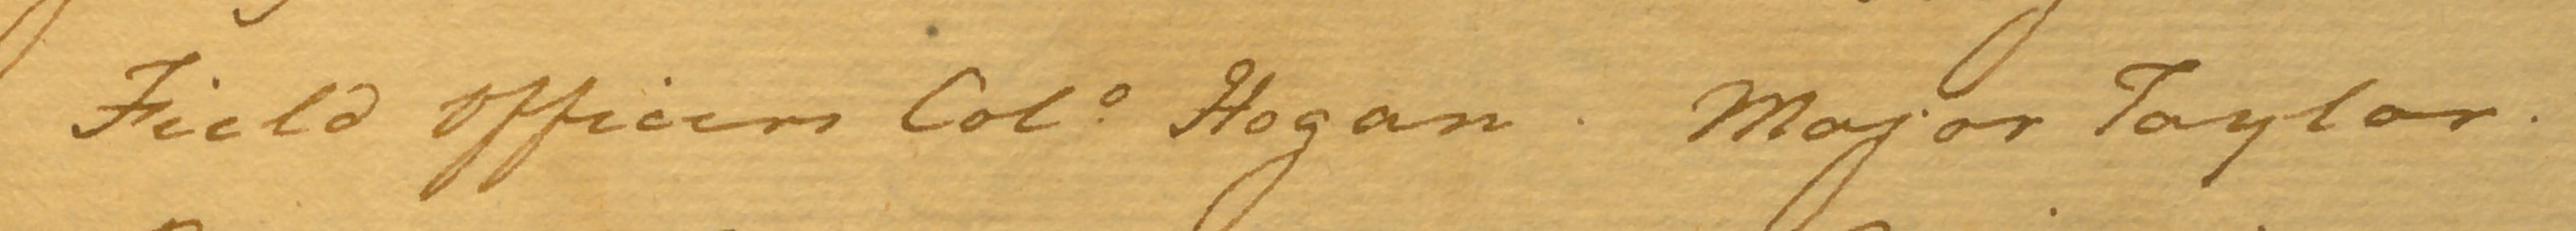Field Officers Col^o. Hogan. Major Taylor
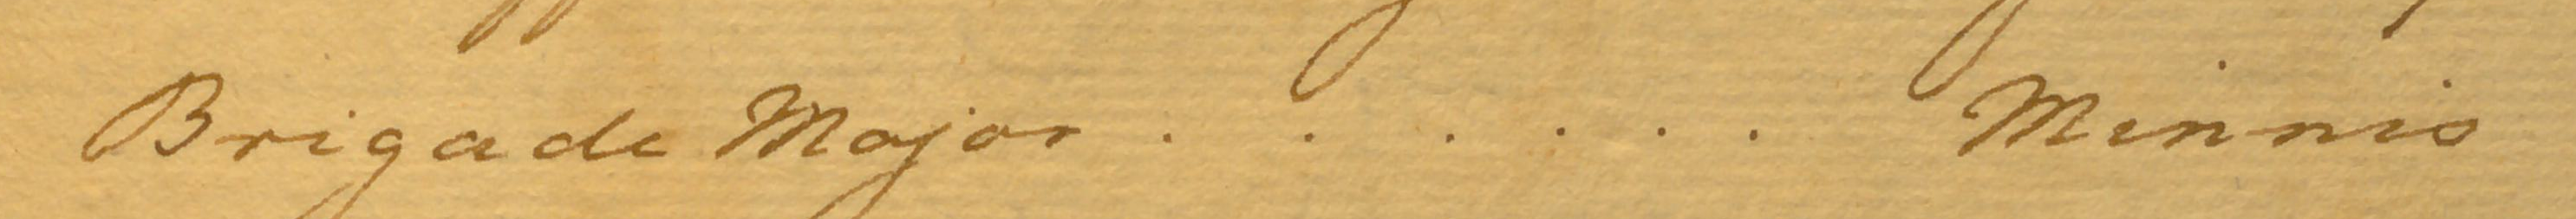Brigade Major ...... Minnis
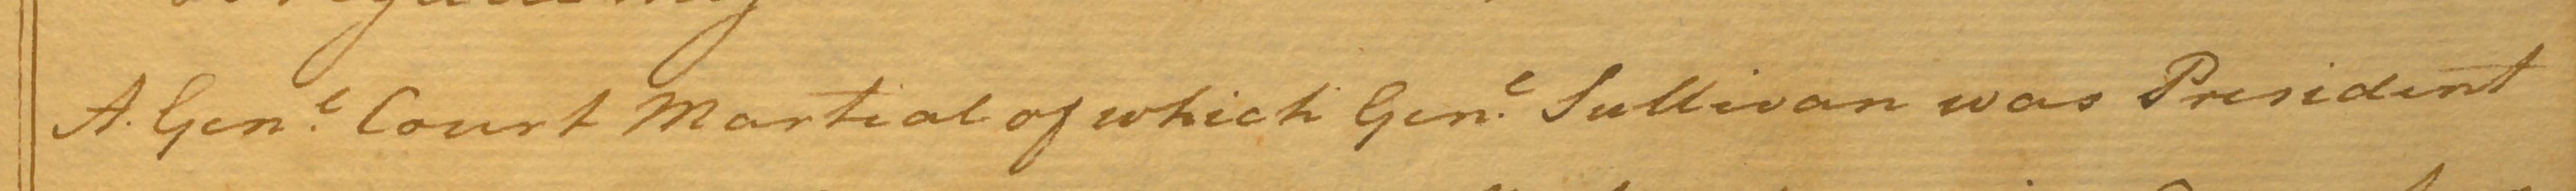A Gen^l. Court Martial of which Gen^l. Sullivan was President
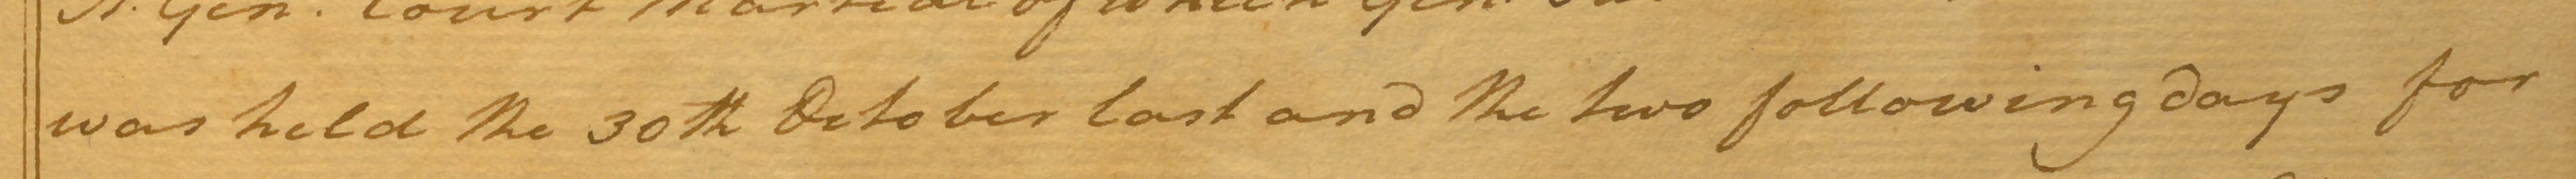was held the 30th October last and the two following days for
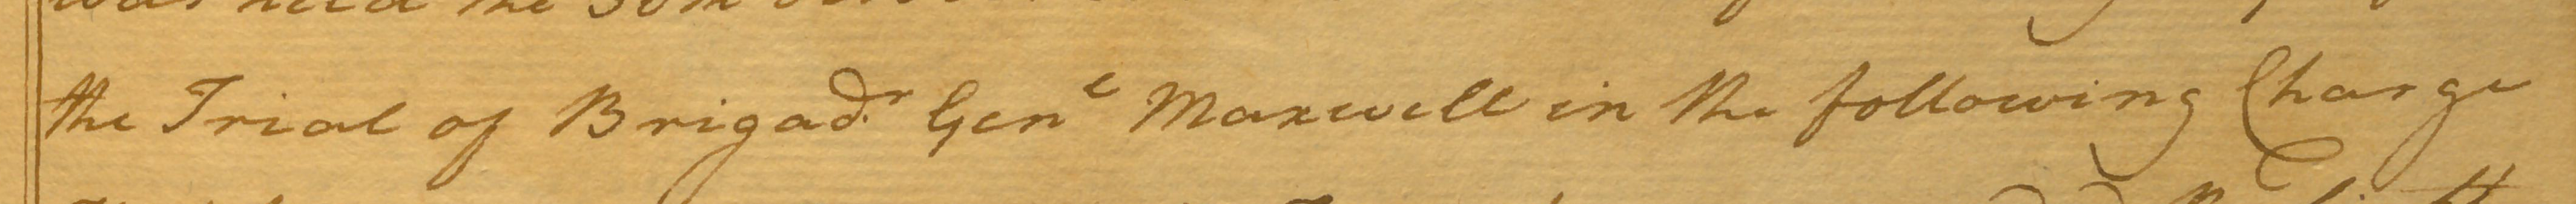the Trial of Brigad^r. Gen^l Maxwell in the following Charge
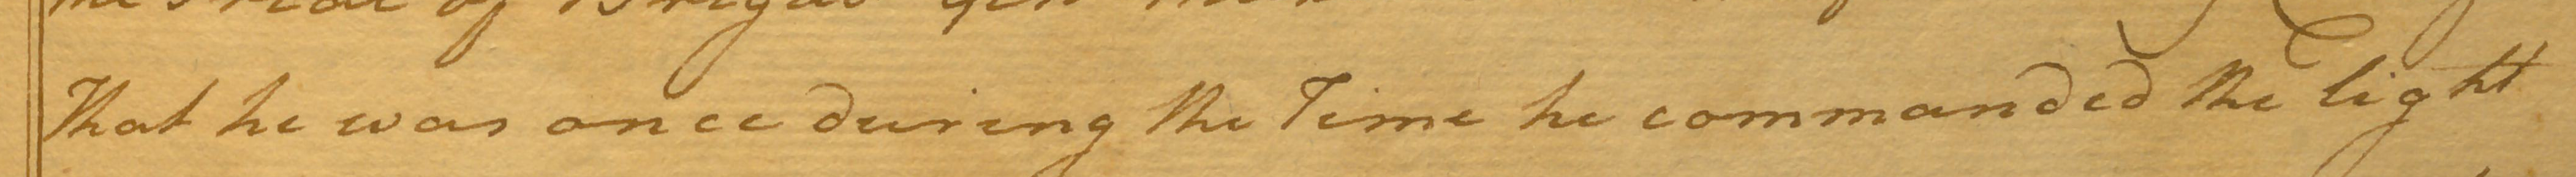That he was once during the Time he commanded the light
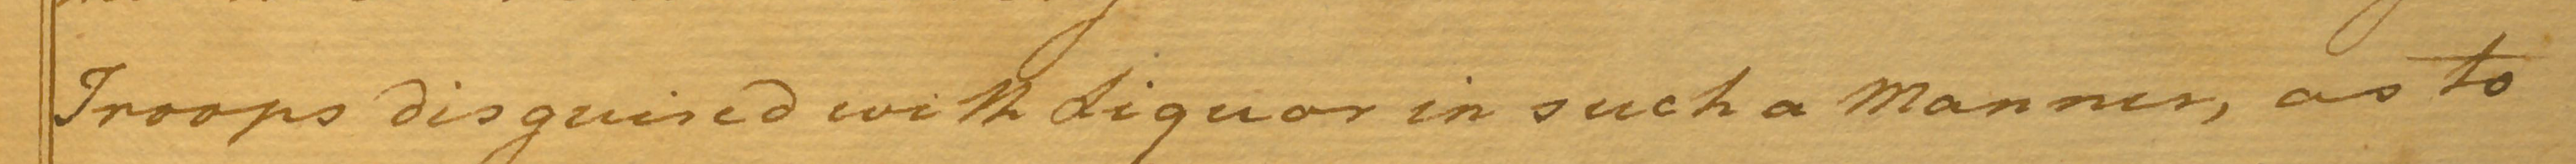Troops disguised with Liquor in such a manner, as to
